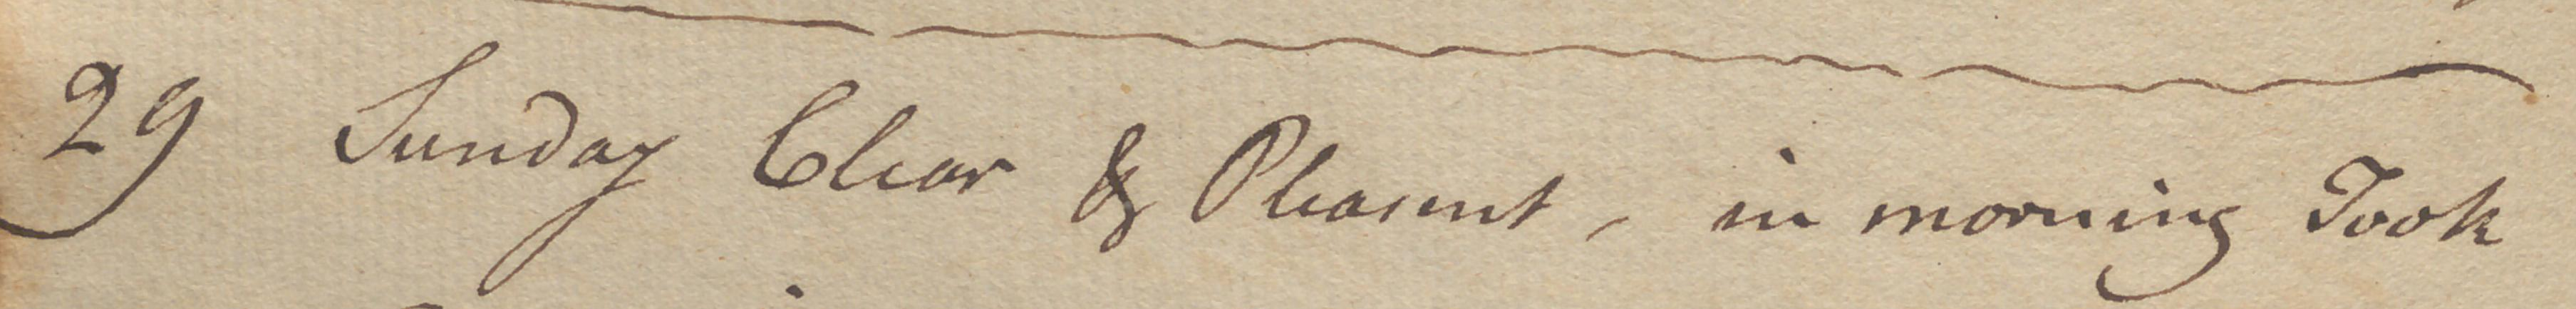29 Sunday Clear & Pleasent, in morning Took
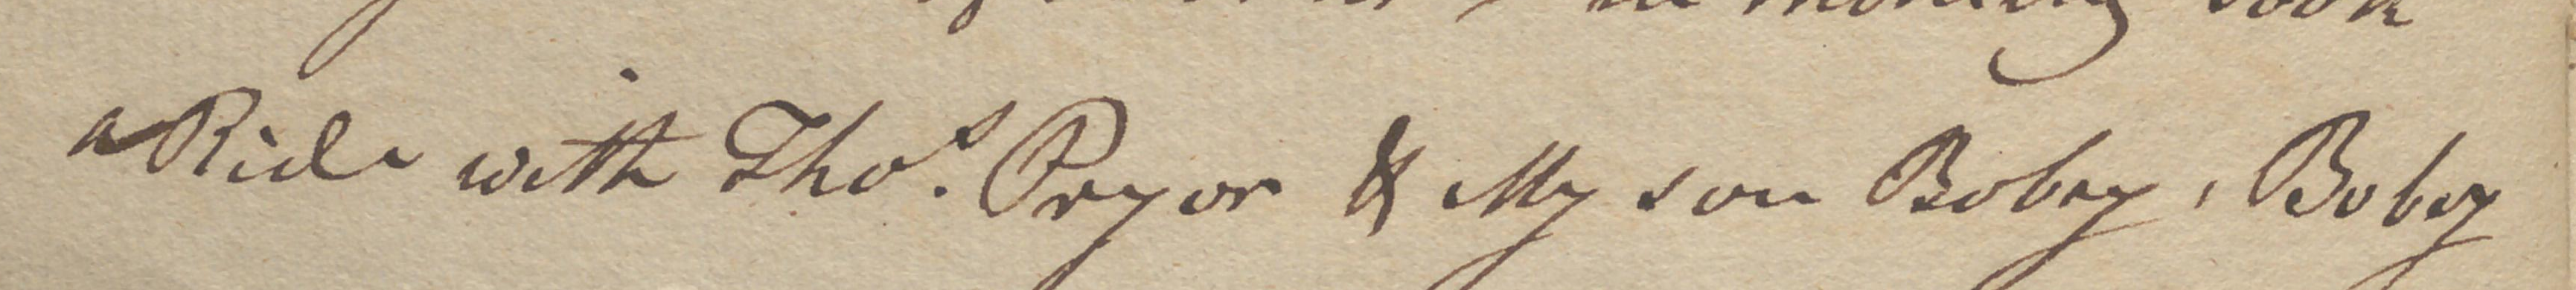a Ride with Tho^s. Pryor & My son Bobey, Bobey
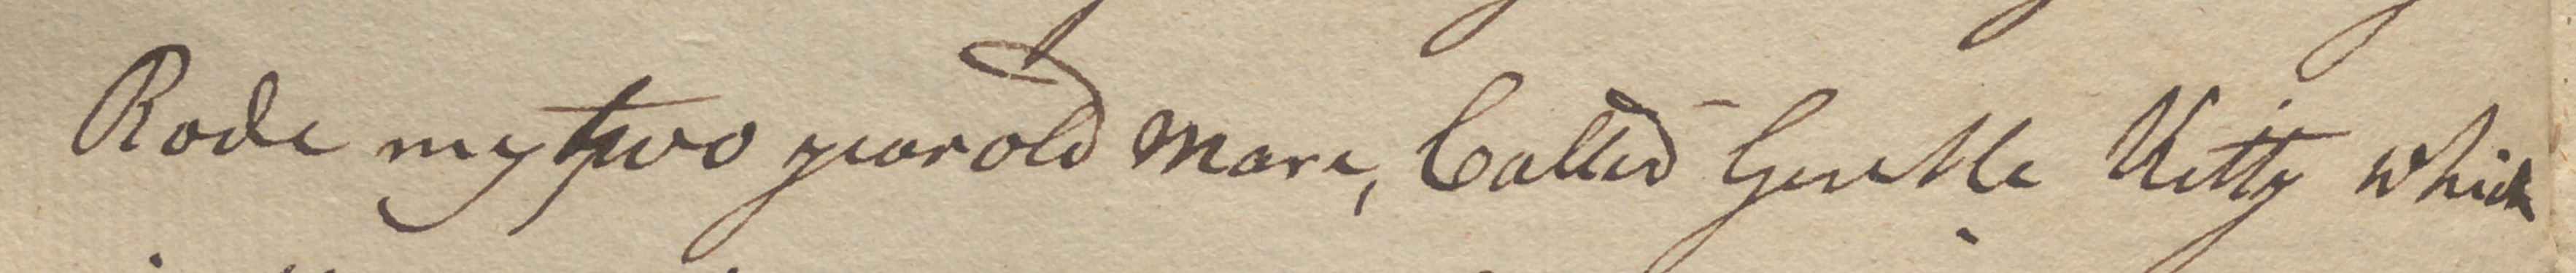Rode my two year old mare, Called Gentle Kitty which
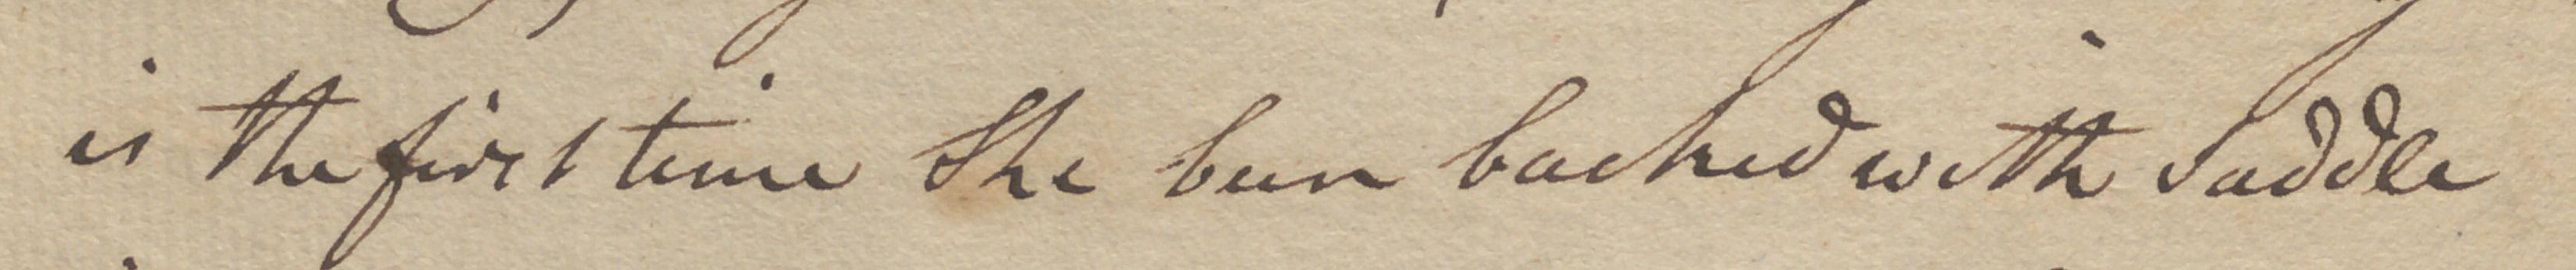is the first time she been backed with Saddle
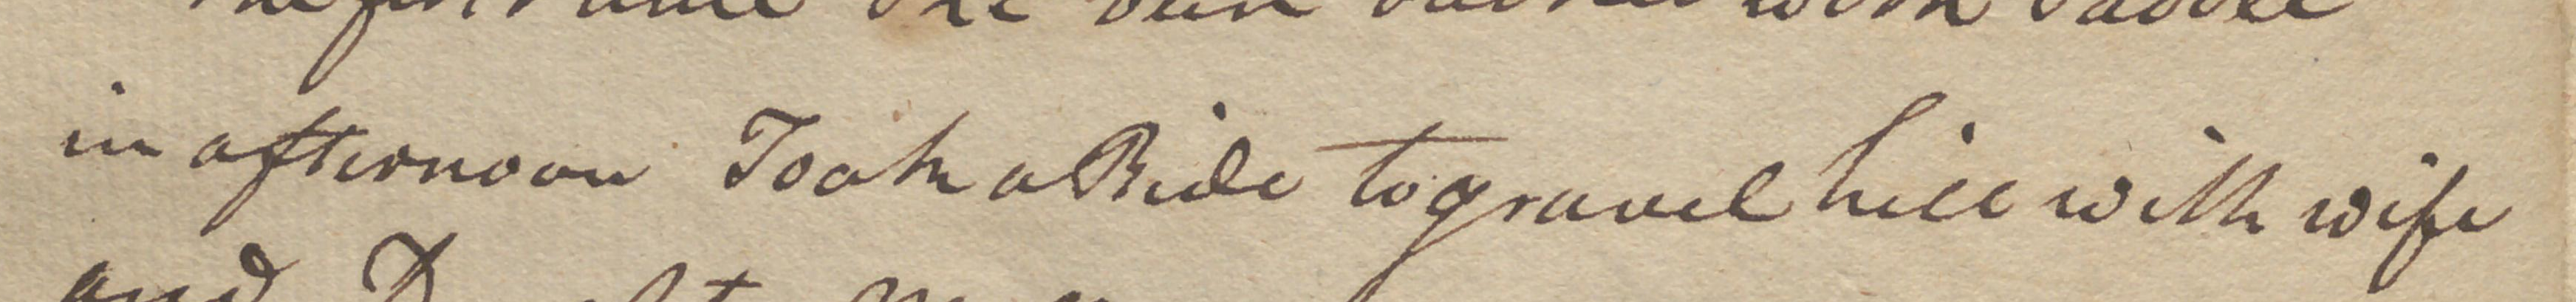in afternoon Took a Ride to gravel hill with wife
